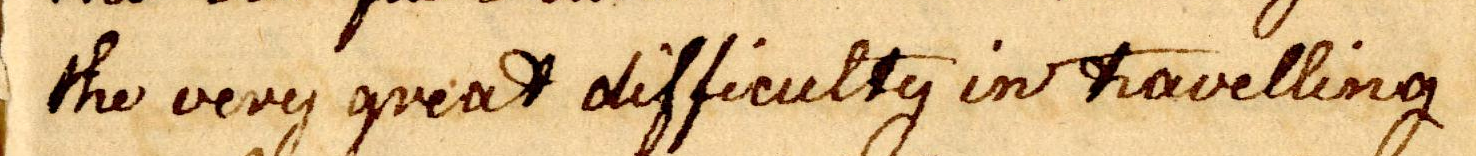the very great difficulty in travelling
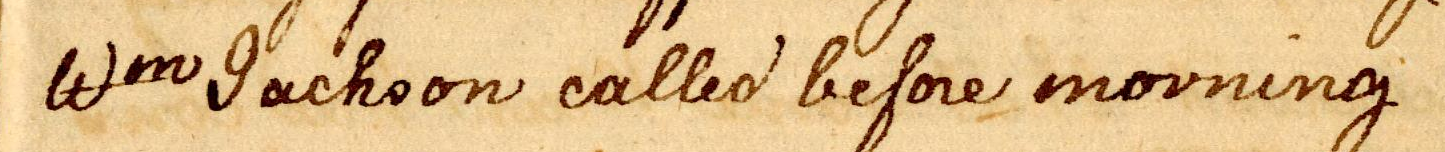W^m Jackson called before morning
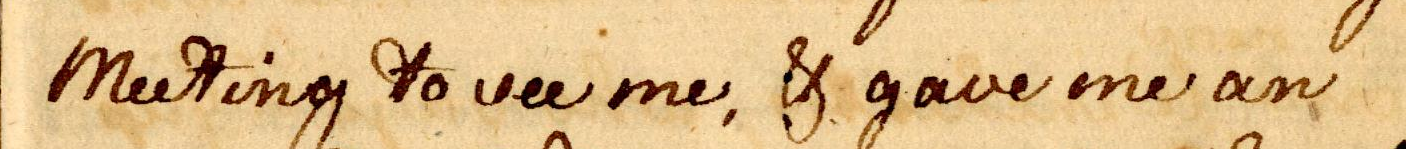Meeting to see me, & gave me an
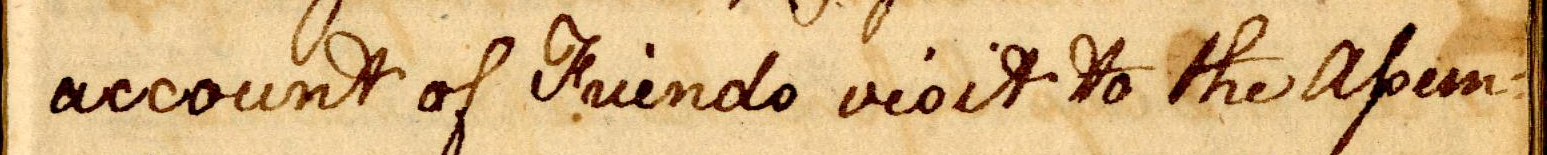account of Friends visit to the Assem-
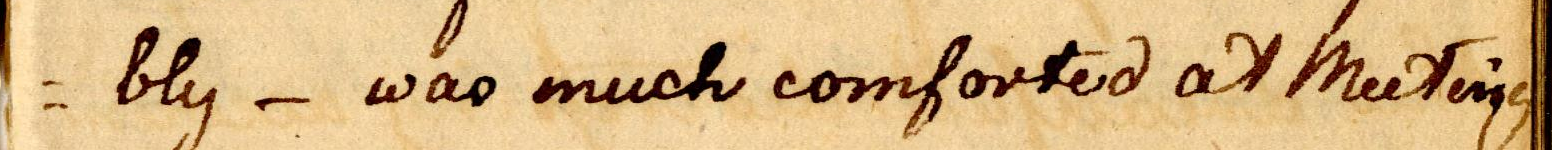-bly- was much comforted at Meeting
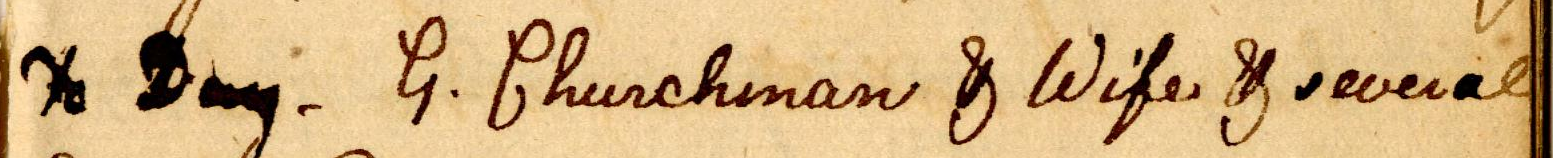to Day- G. Churchman & Wife & several
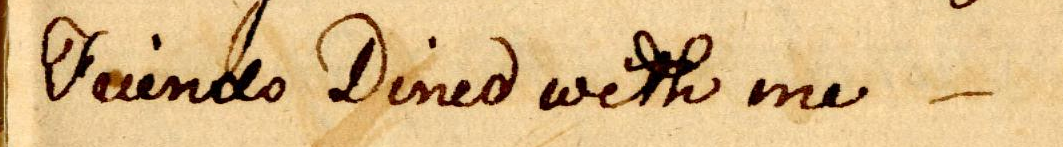Friends Dined with me-
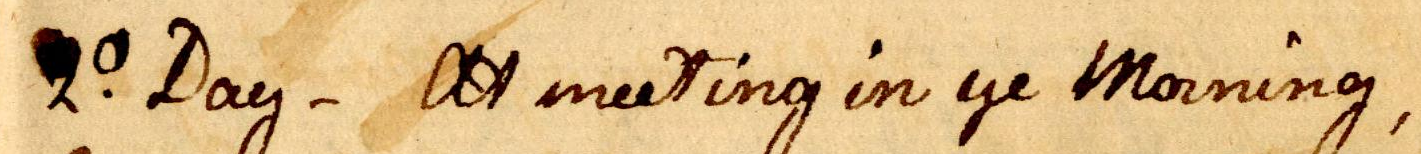2^d. Day- At meeting in ye Morning,
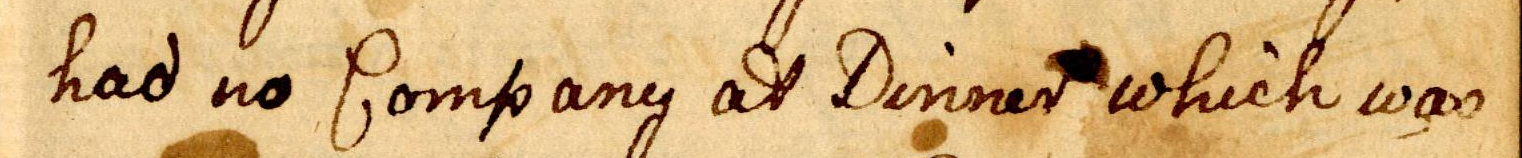had no Company at Dinner which was
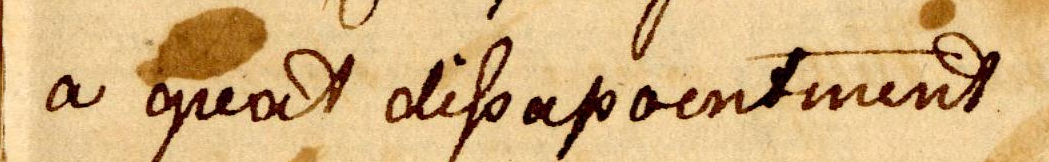a great dissapointment
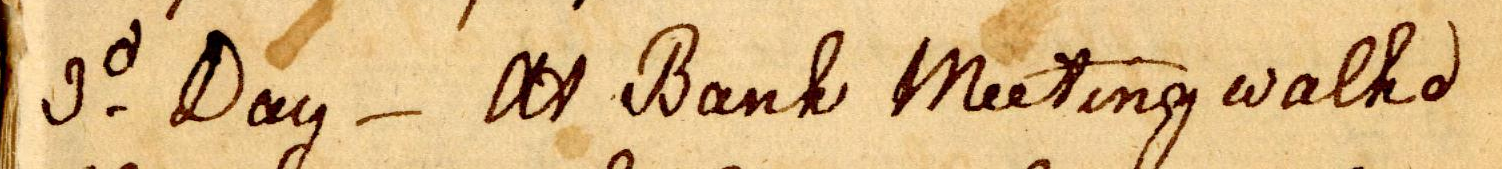3^d. Day- At Bank Meeting walkd
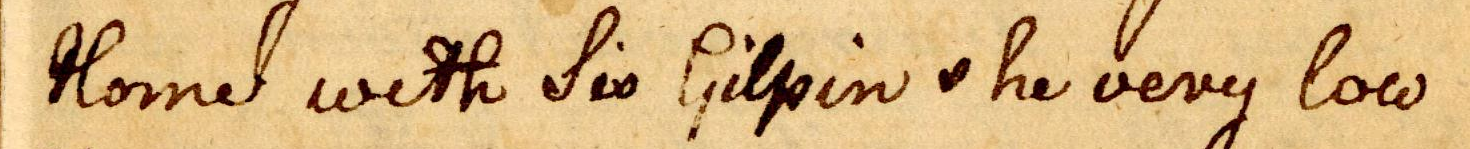Home with Sis Gilpin she very low
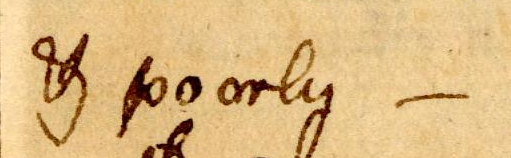& poorly-
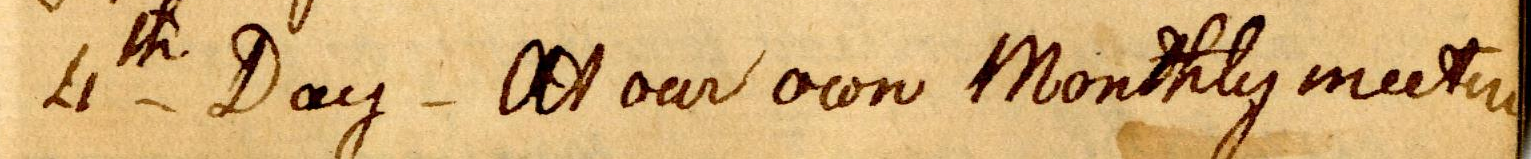4^th Day- At our own Monthly meetng
